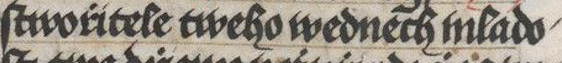ſtwoṙitele tweho we dnech mlado¬
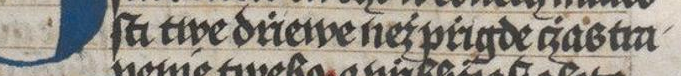ſti twe dṙiewe neż pṙigde cżas tra¬
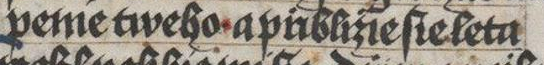penie tweho.a pṙibliżie ſie leta
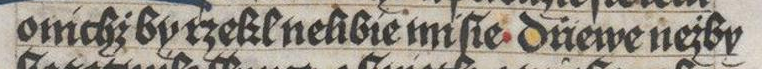o nichż by ṙzekl nelibíe mi ſíe. Dṙiewe neżby
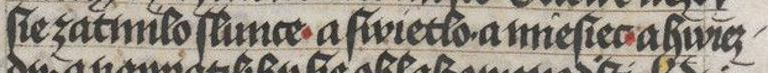ſie zatmilo ſlunce.a ſwietlo.a mieſiec.a hwiez¬
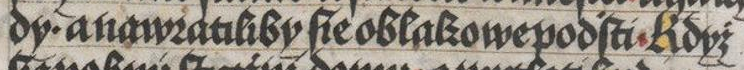dy.a nawratili by ſíe oblakowe podṡti. Kdyż
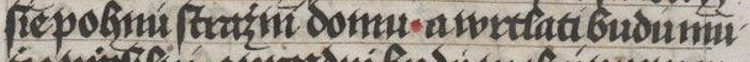ſie pohnu ſtrażní domu. a wrtlati budú mu¬
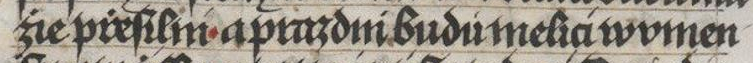żie pṙeſilní. a prazdni budú melicí w vmen¬
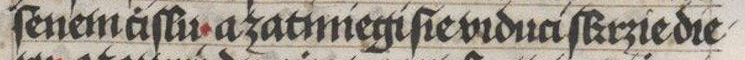ẛenem ċiẛlu.a zatmiegi ẛíe viducí ſkrzie díe¬
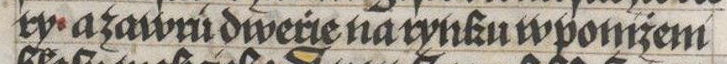ry. a zawrú dweṙie na rynku w poníżení
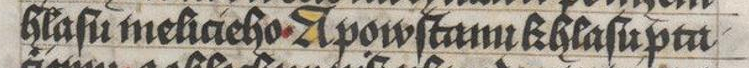hlaſu melicíeho.A powſtanu k hlaſu pta¬
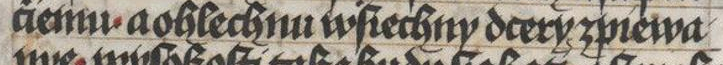ċíemu.a ohlechnu wẛiechny dcery zpiewa¬
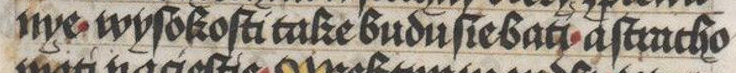nye. wyſokoſti take budu ſie bati.a ſtracho¬
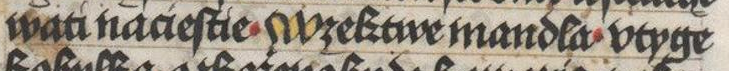wati na cieſtie.Wzektwe mandla.vtyge
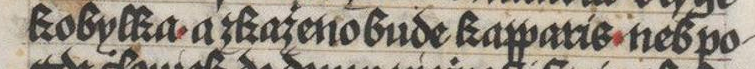kobylka. a zkażeno bude kapparis.neb po¬
